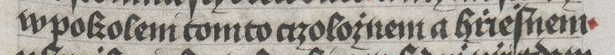wpokolem tomto cizolożnem a hṙíeẛnem.
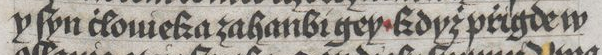y ſyn ċlouieka zahanbí gey.kdyż pṙigde w¬
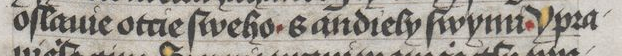oſlaie otcie ſweho.s andiely ſwymi.Y pra¬
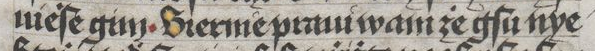uíeẛe gím.Viernie praui wam że gſu nye¬
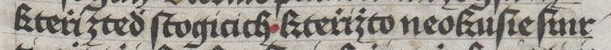kteṙí zteḋ ſtogicich.kteṙíżto neokuſie ſmr¬
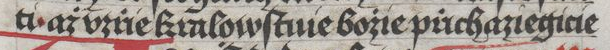ti aż uzṙíe kralowſtuíe bożíe pṙichaziegícíe
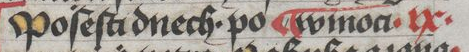Poẛeſti dnech.po wmoci.ix.
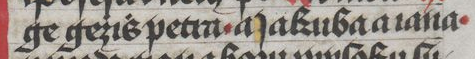ge geżiṡ petra.a Iakuba a iana.
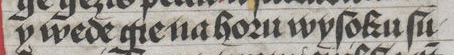y wede gie na horu wyſoku ſu
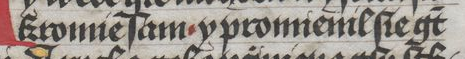kromie ſam.y promienil ſe ḡt
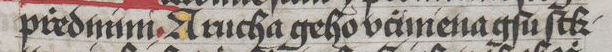pṙednimi A rucha geho vċiníena gſu ſtk¬
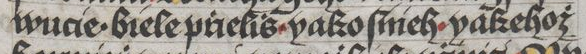wucíe.bíele pṙieliš.yako ſníeh.yakehoż
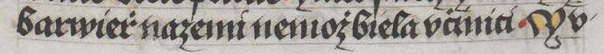barwíeṙ nazemí nemoż biela vċiniti.Y v¬
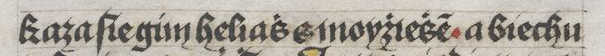kaza ſíe gím heliaš a moyżieẛē.a bíechu
